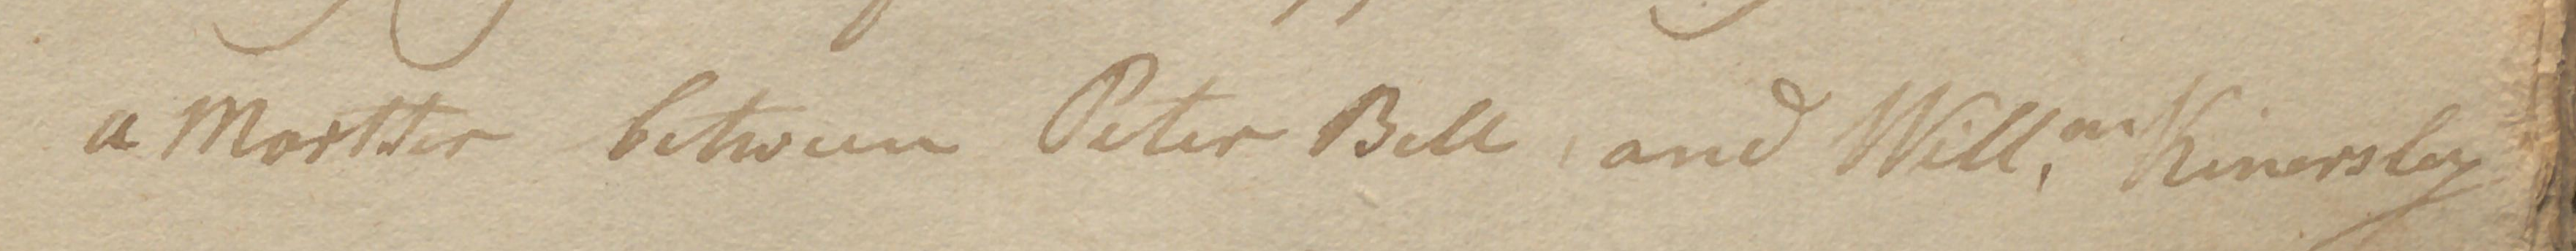a Mortter between Peter Bell and Will^m Kinersley
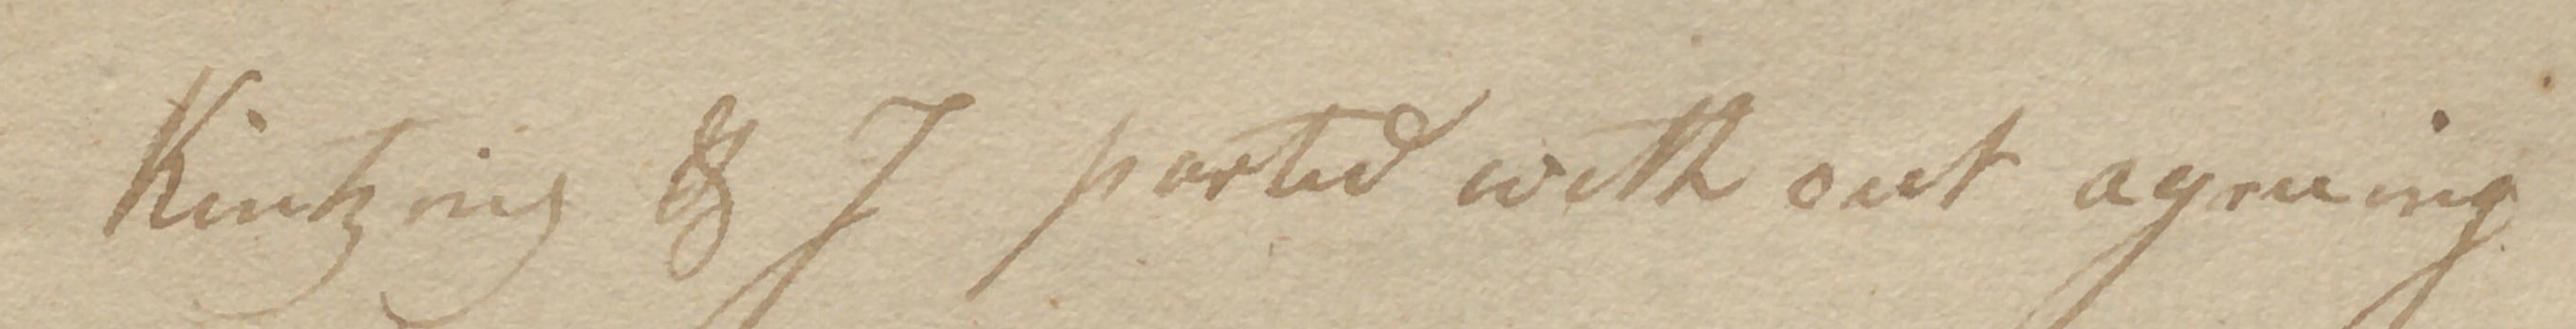Kintzing & I parted with out agreeing
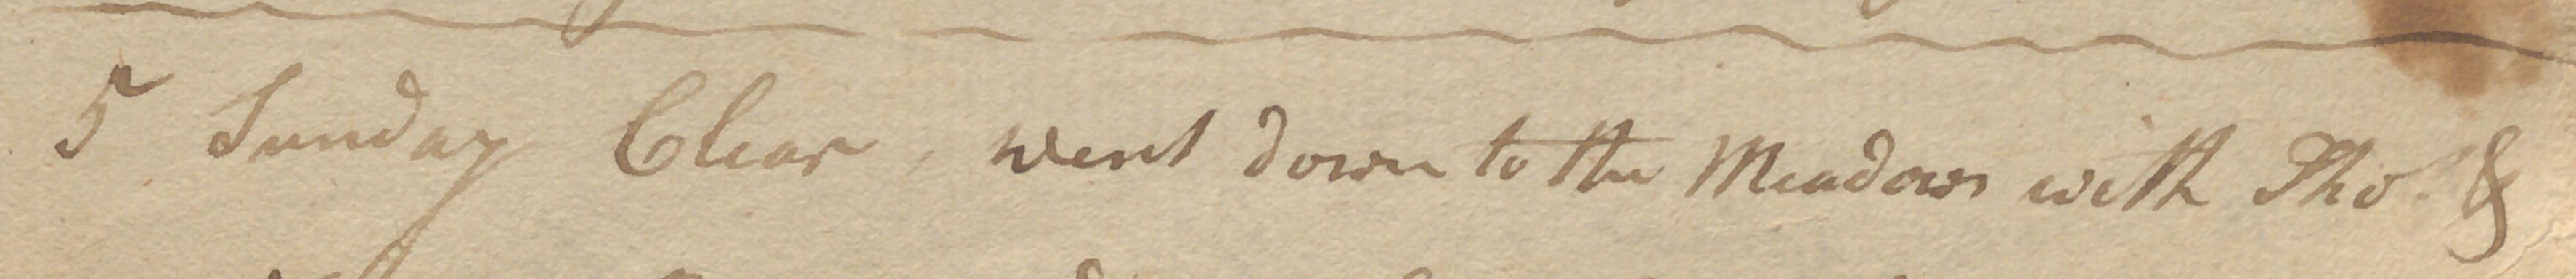5 Sunday Clear, went down to the Meadows with Tho^s. &
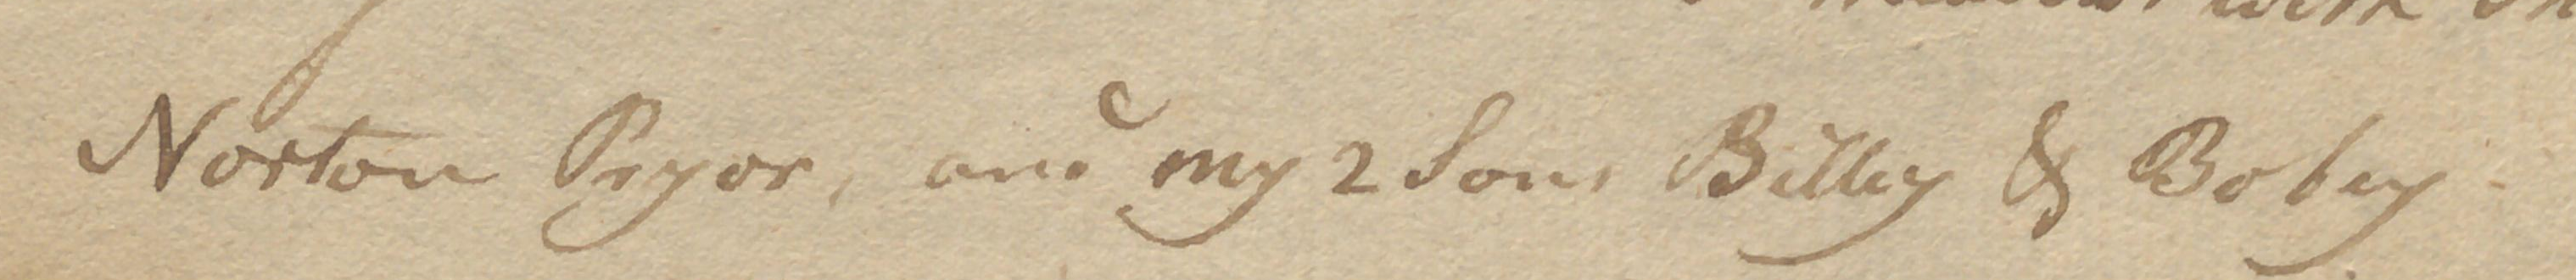Norton Pryor, and my 2 Sons Billey & Bobey
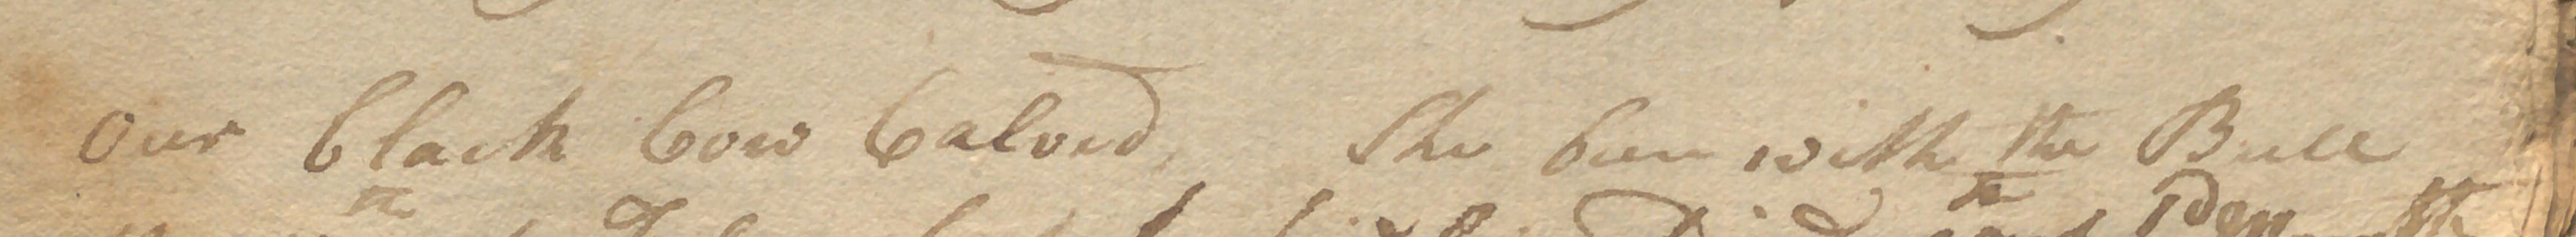our black Cow Calved, She been with the Bull
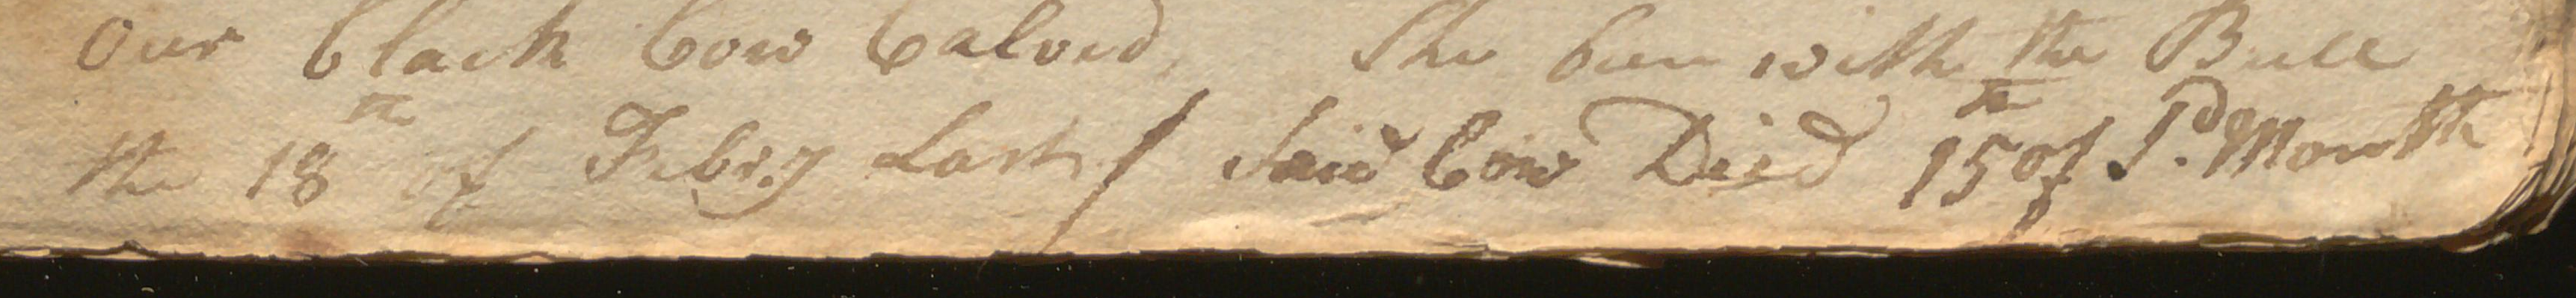the 18^th of Febr^y. Last / Said Cow Died 15^th. of s^d. Month
